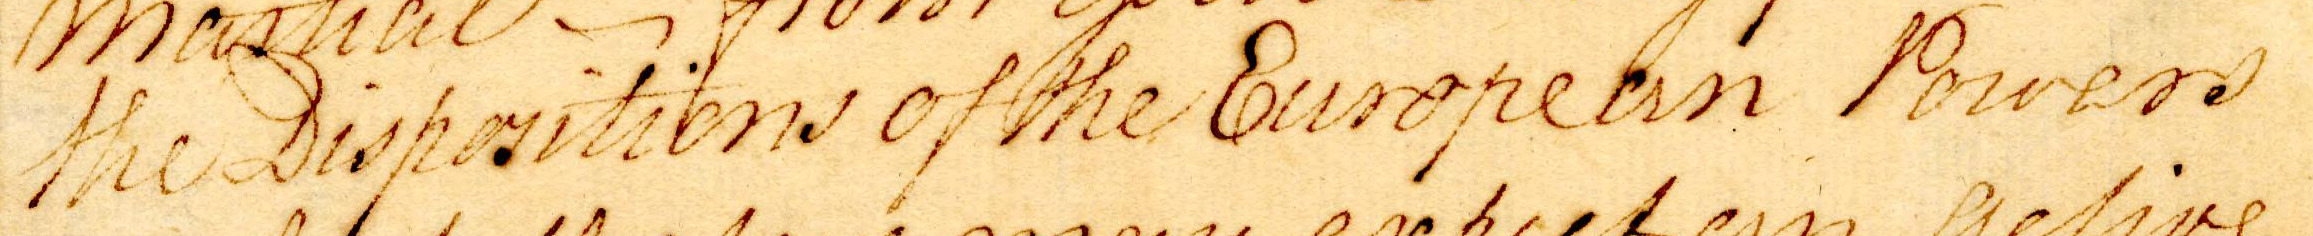the Dispositions of the European Powers
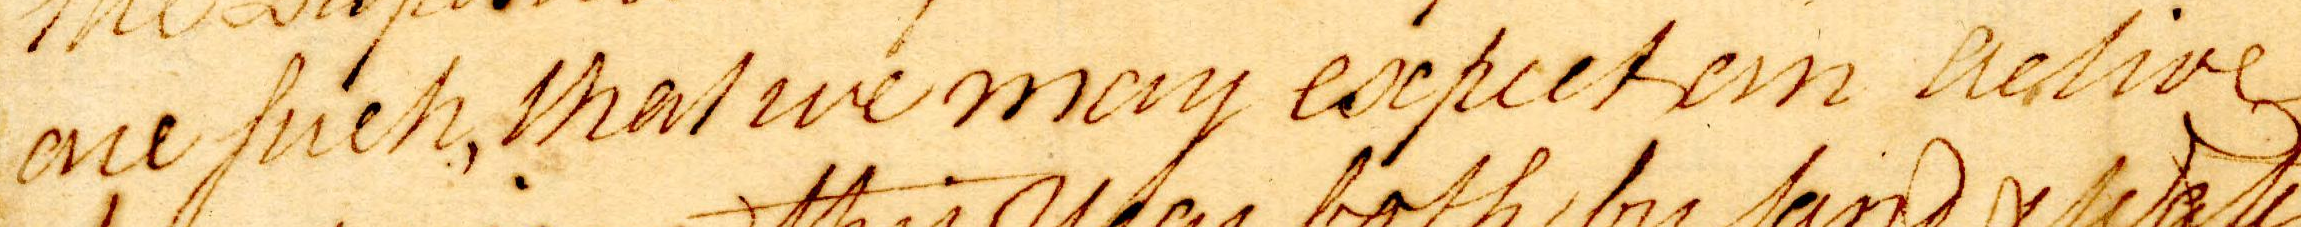one such, that we may expect an active
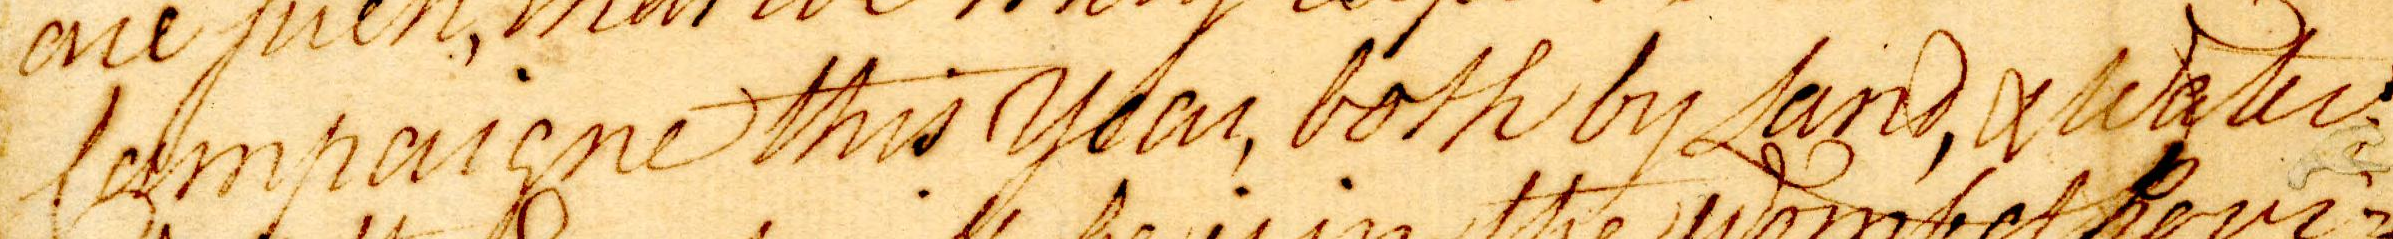Campaigne this Year, both by Land, & Water
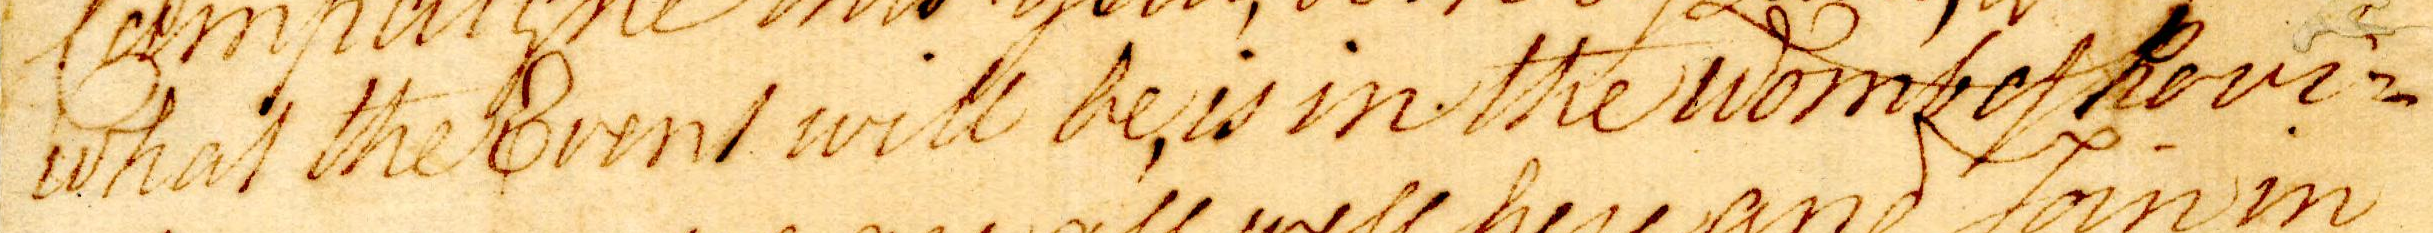what the Event will be, is in the Womb of Provi-
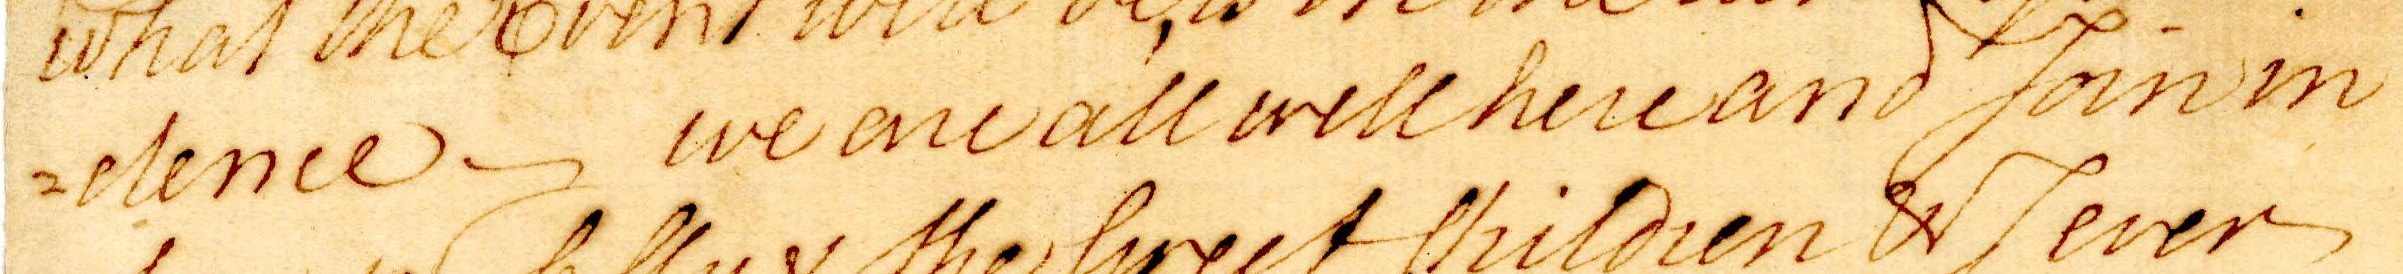-dence. We are all well here and Join in
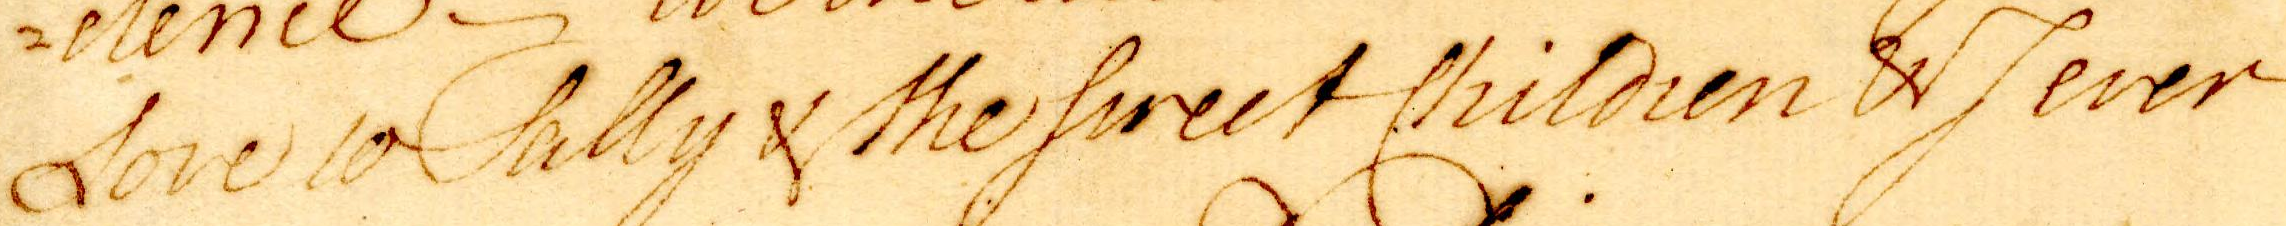Love to Sally & the sweet Children & I ever
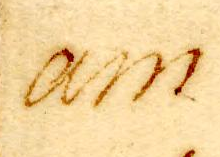am
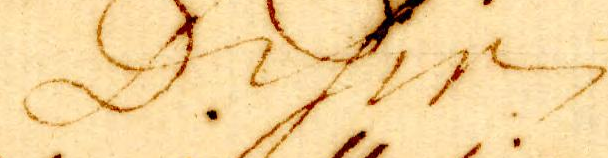D^r Sir
